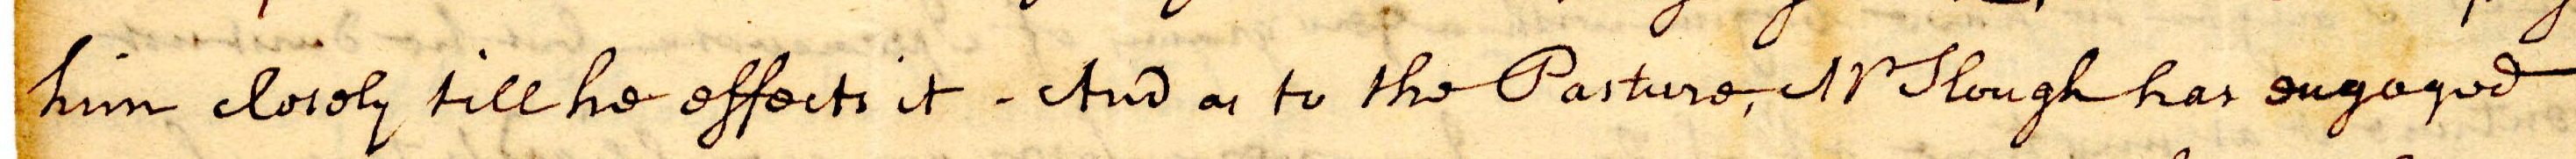him closely till he affects it- And as to the Pasture, M^r Slough has engaged
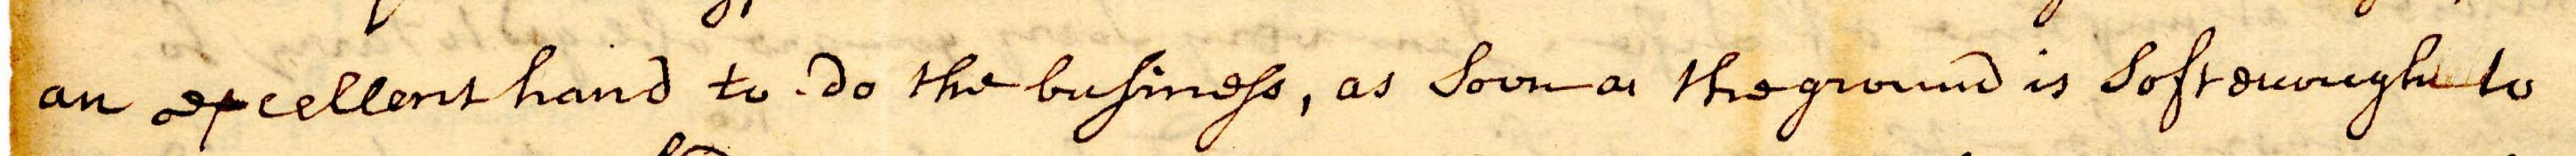an excellent hand to do the business, as Soon as the ground is Soft enough to
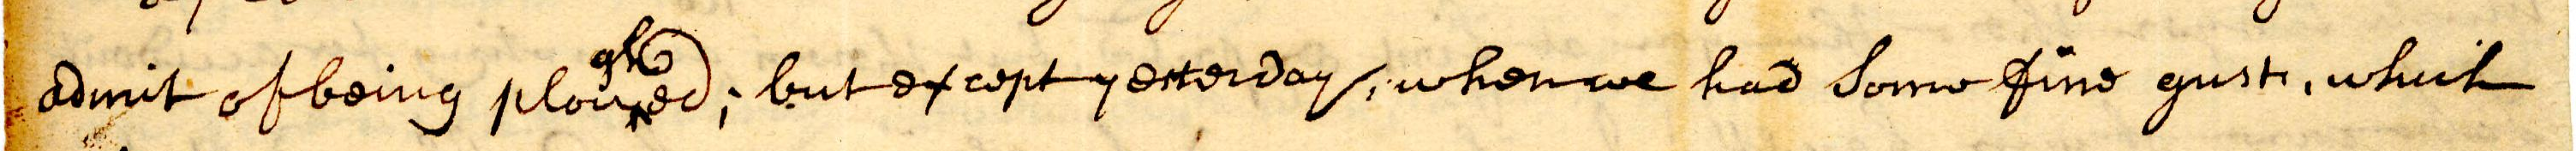admit of being ploughed; but except yesterday, when we had Some fine gusts, which
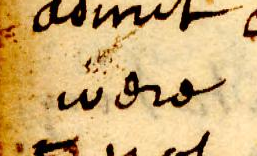were
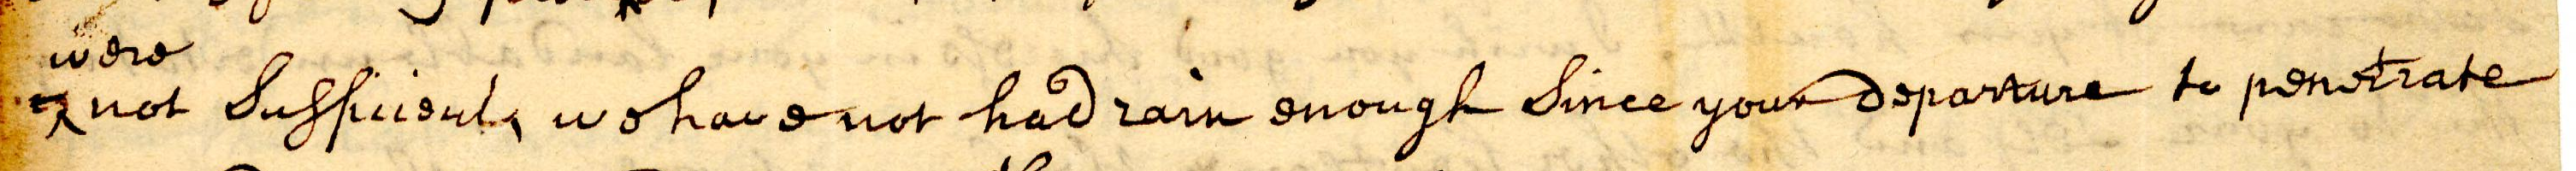^ not Sufficent we have not had rain enough Since your departure to penetrate
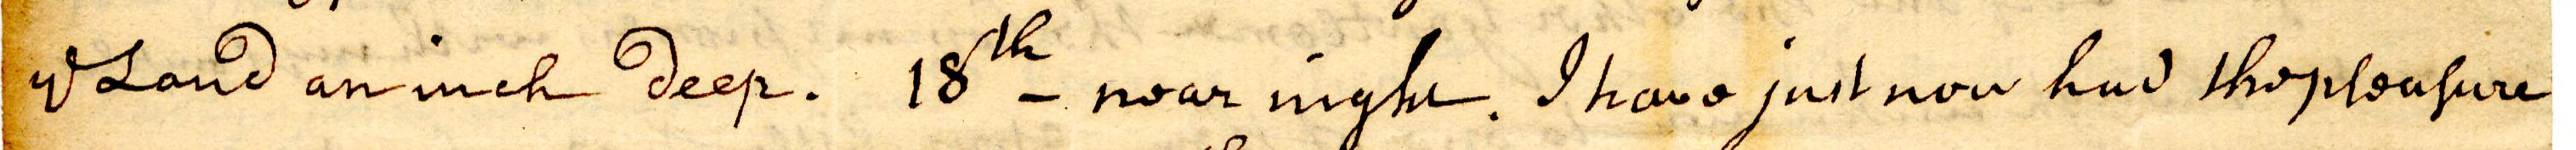y^e Land an inch deep. 18^th- near night. I have just now had the pleasure
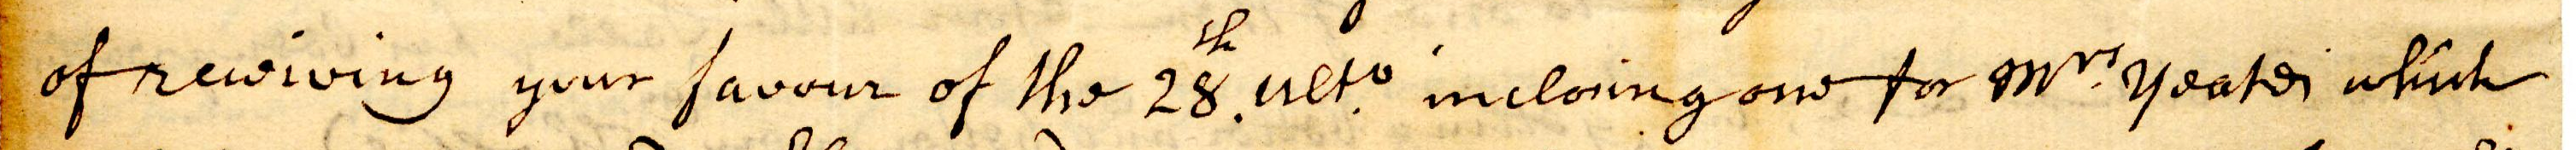of reviewing your favour of the 28^th ult^o inclosing one for M^rs. Yeates which
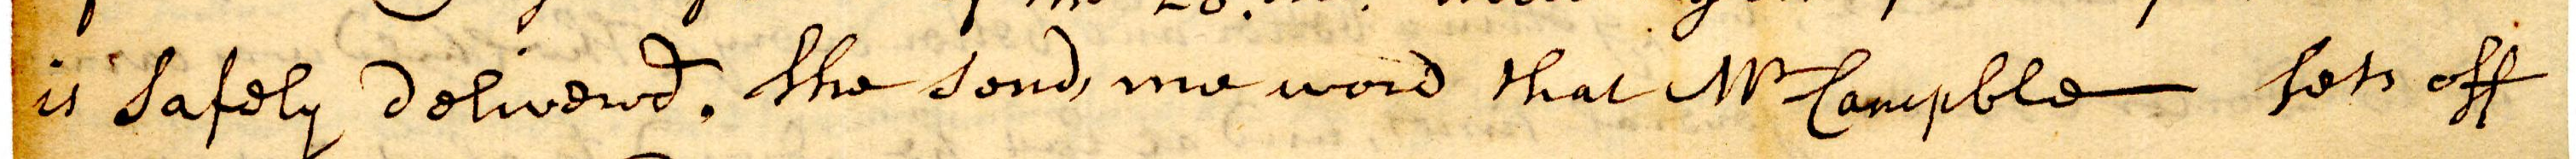is Safely delivered. She sends me word that M^r Campble sets off
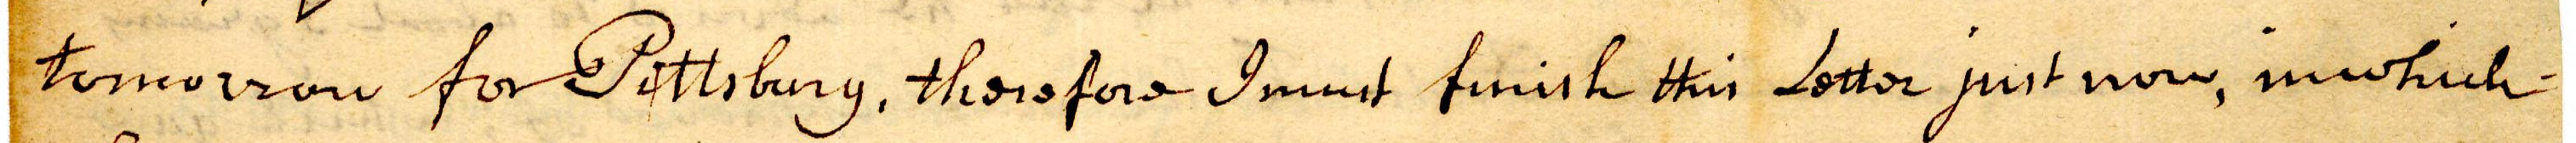tomorrow for Pittsburg, therefore I must finish this Letter just now, in which
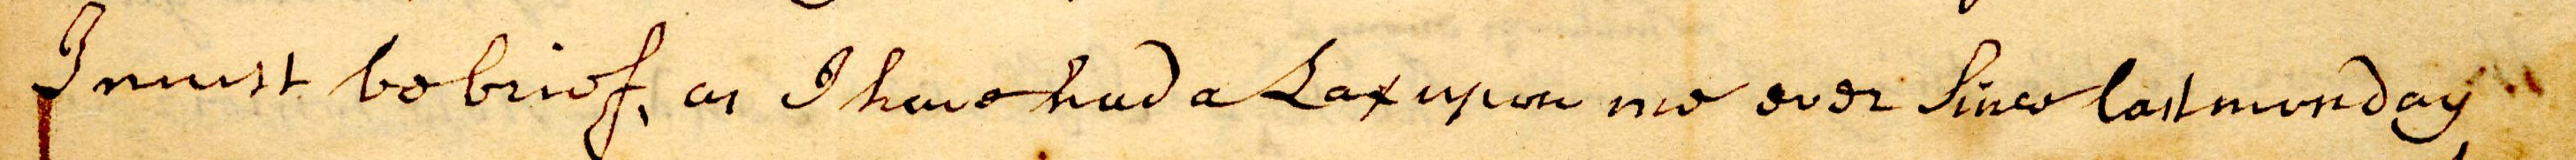I must be brief, as I have had a Lax upon me ever Since last monday
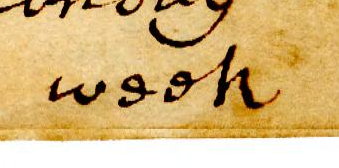week
